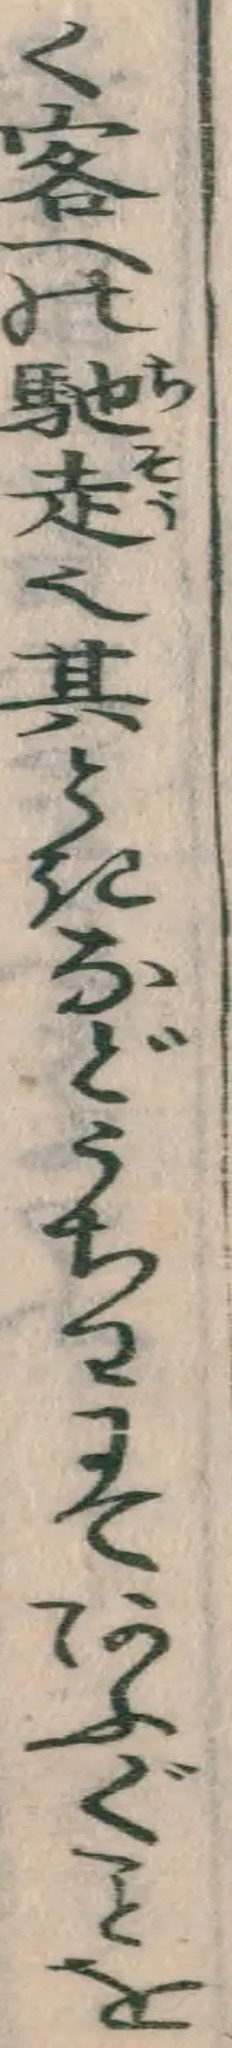く客への馳走也其ときなどうちわにてあふぐことを
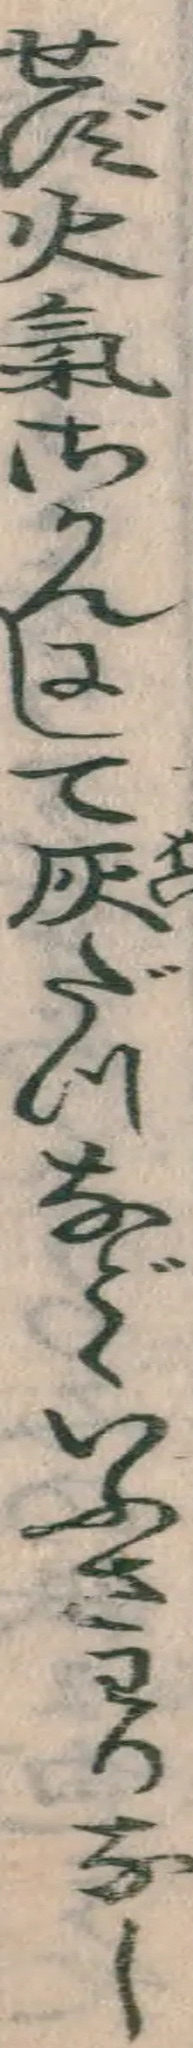せず火氣さかんにして灰だつなどゝいふさわりなし
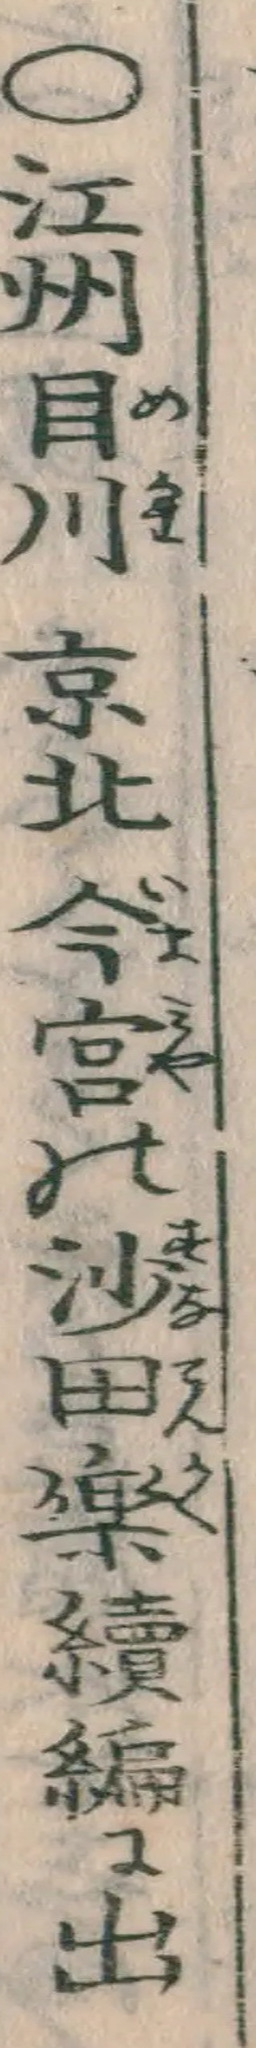○江州目川京北今宮の沙田樂續編に出
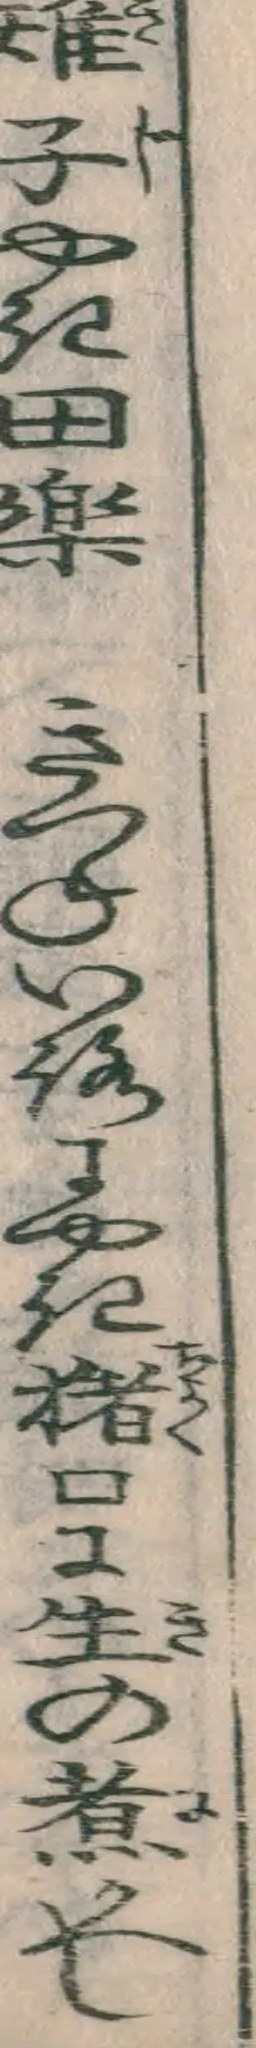[二]雉子やき田樂きつねいろにやき猪口に生の煮かへし
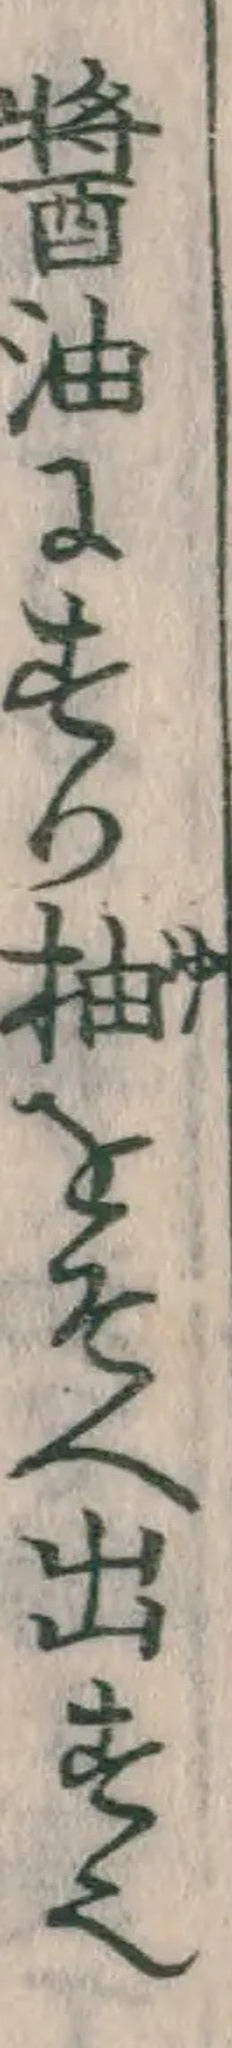醤油にすり柚をそへ出す也

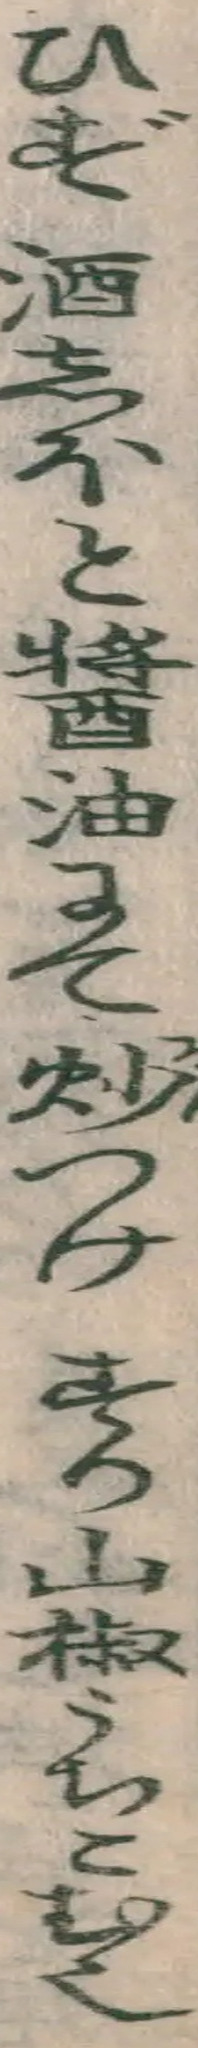ひず酒しほと醤油にて炒つけすり山椒うちこむ也
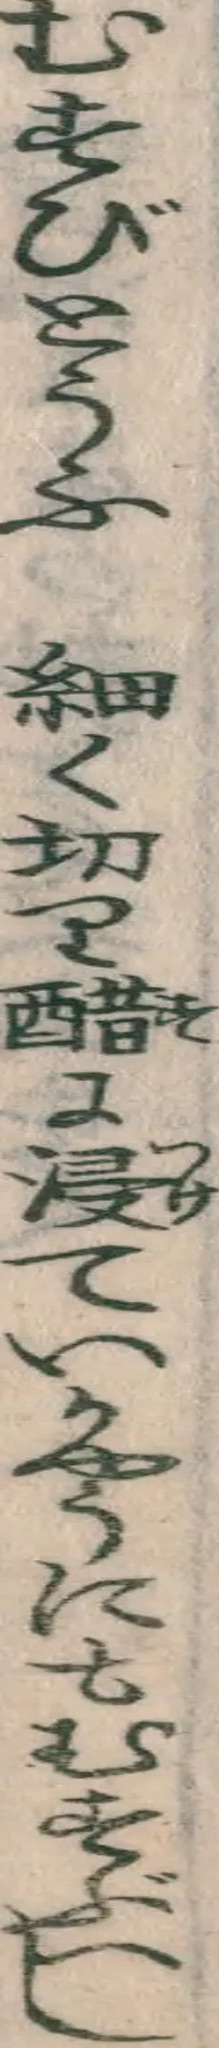[四]むすびとうふ細く切り醋に浸ていかやうにもむすぶへし
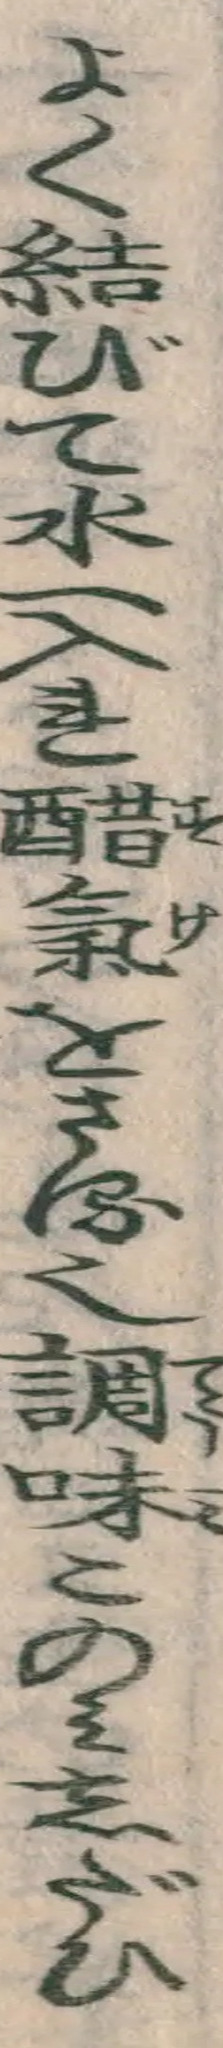よく結びて水一入れ醋氣をさる也調味このみしだひ
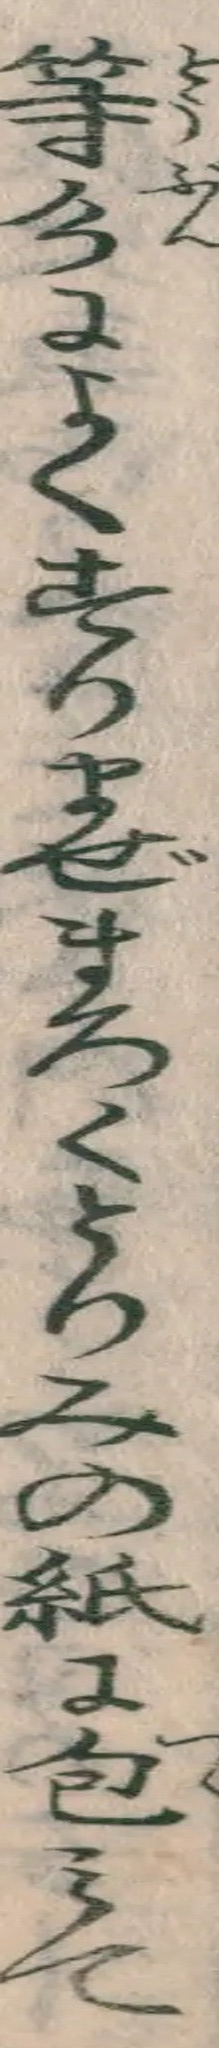等分によくすりまぜまろくとりみの紙に包みて
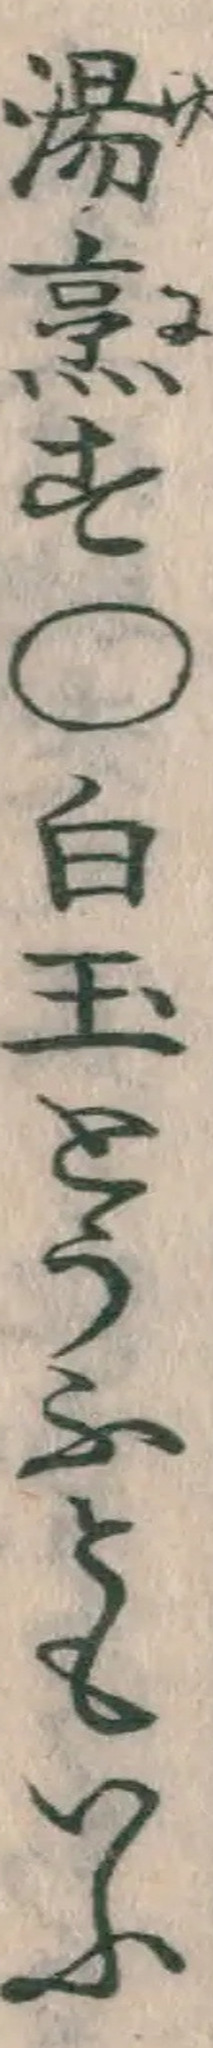湯烹す○白玉とうふともいふ
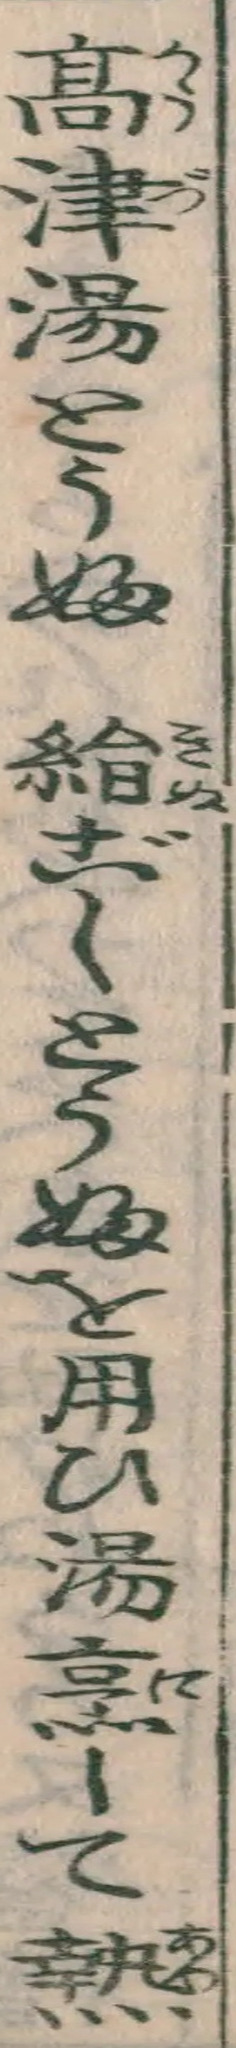[六]髙津湯とうふ絹ごしとうふを用ひ湯烹して熱
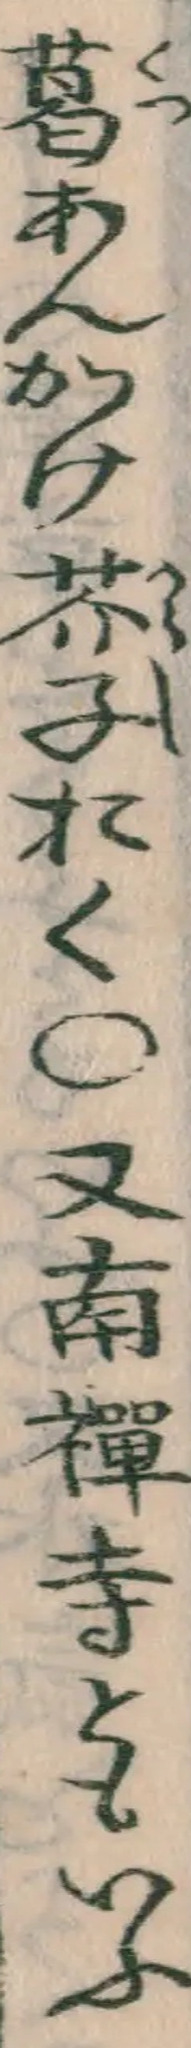葛あんかけ芥子おく○又南禪寺ともいふ
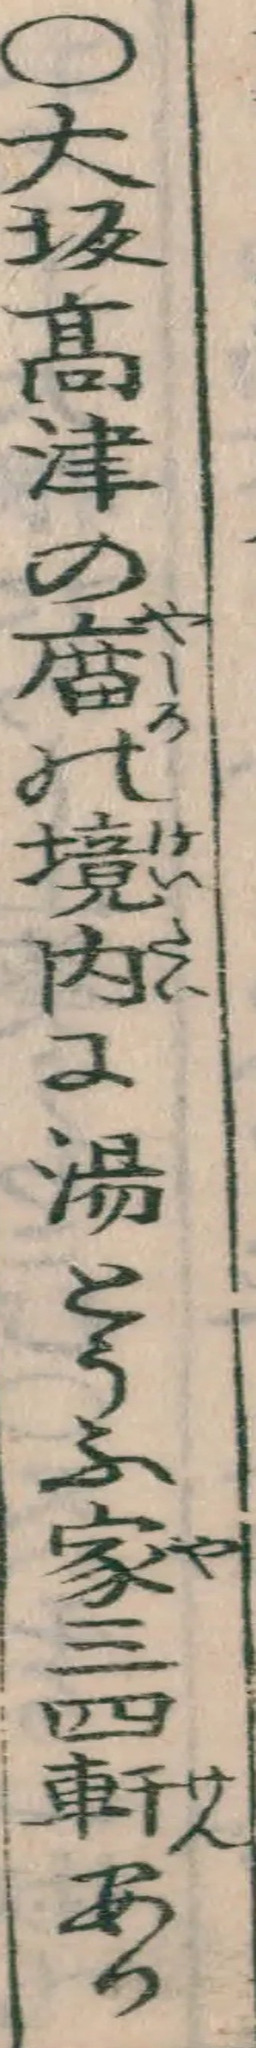○大坂髙津の庿の境内に湯とうふ家三四軒あり
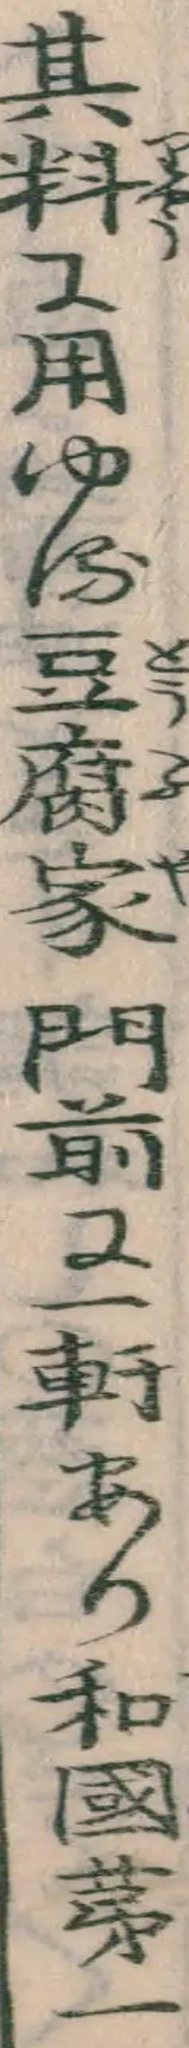其料に用ゆる豆腐家門前に一軒あり和國第一
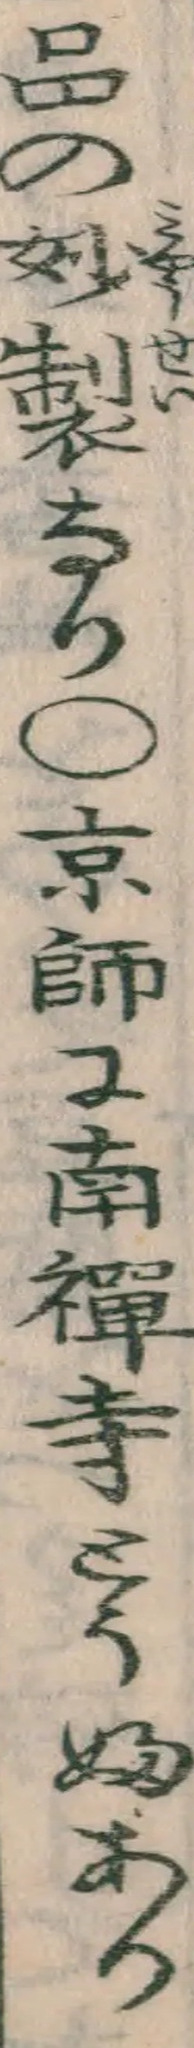品の妙製なり○京師に南禪寺とうふあり
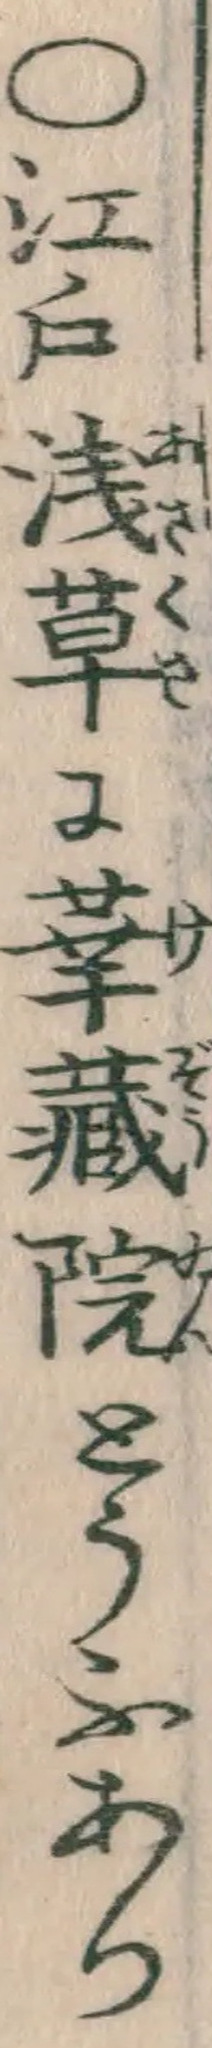○江戸浅草に華藏院とうふあり
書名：豆腐百珍. [正編]
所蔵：国立国会図書館 National Diet Library, JAPAN
